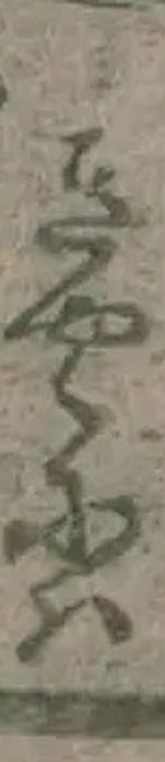きやくには
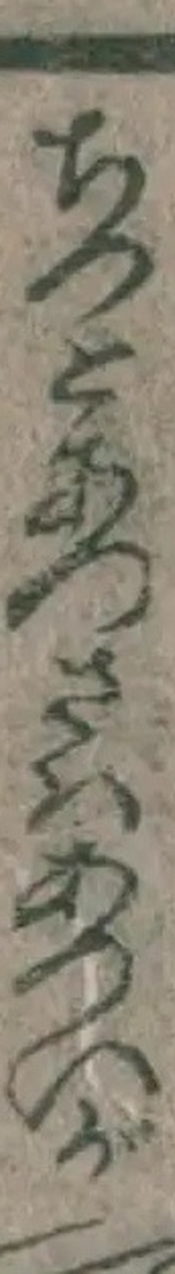ちつとあつさはあついが
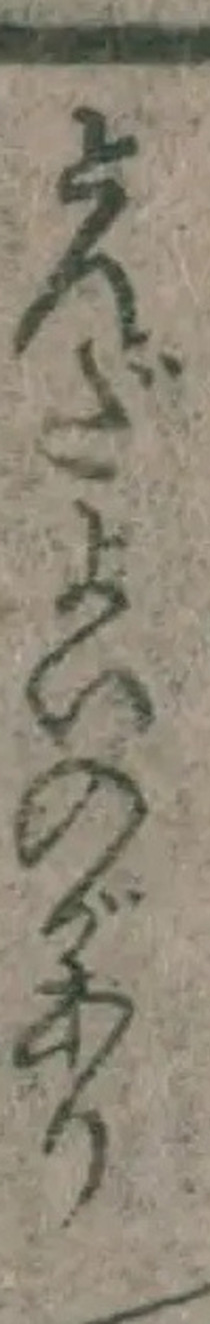とんだよいのがあり
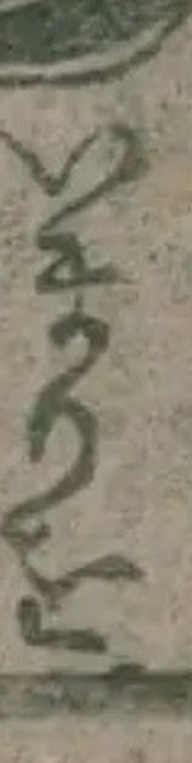いまりを
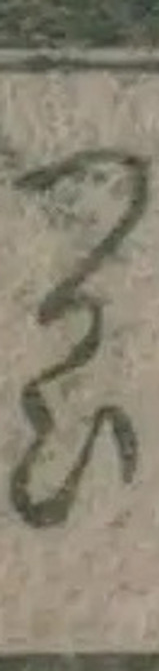つかひ
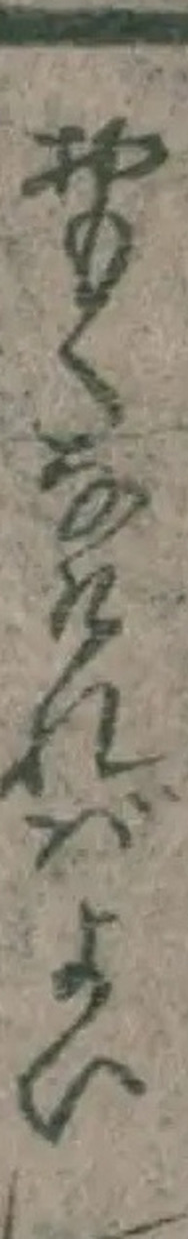おもくなければよい
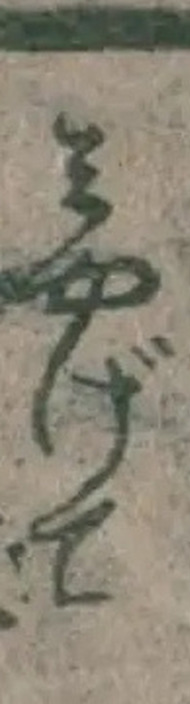みやげて
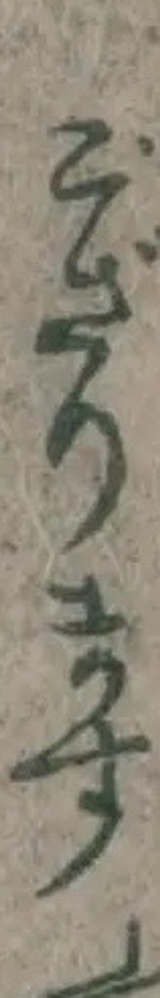ござります

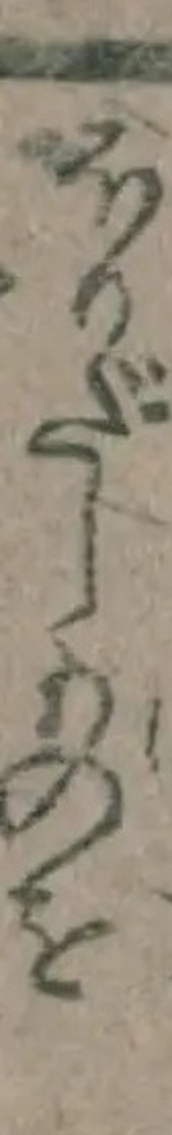ほりだしものを
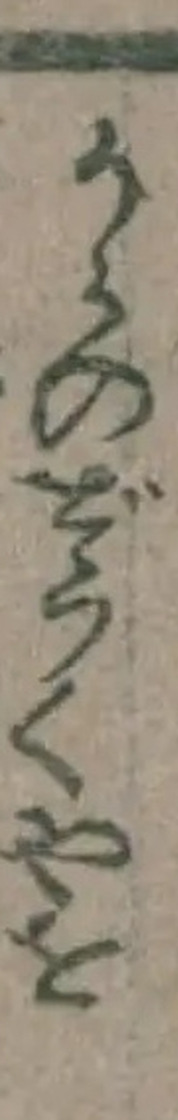からのどうくやを
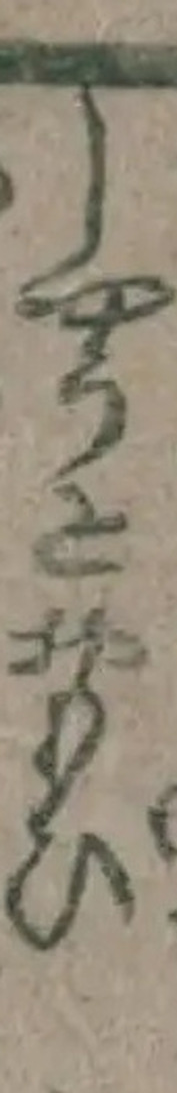しやうとおもひ
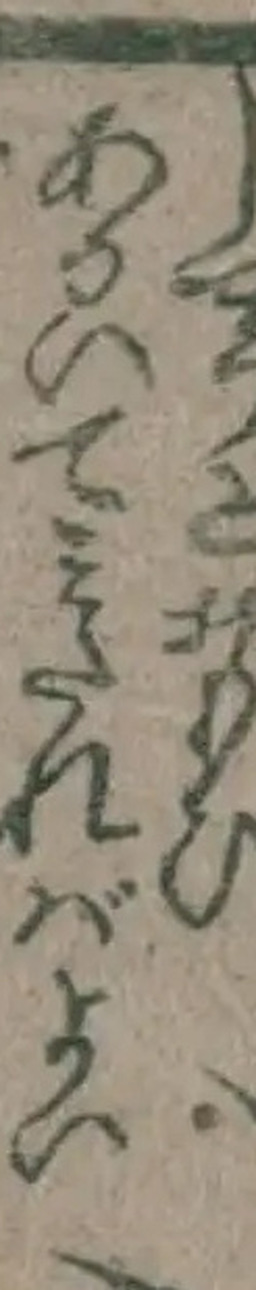あるいてみたればよい
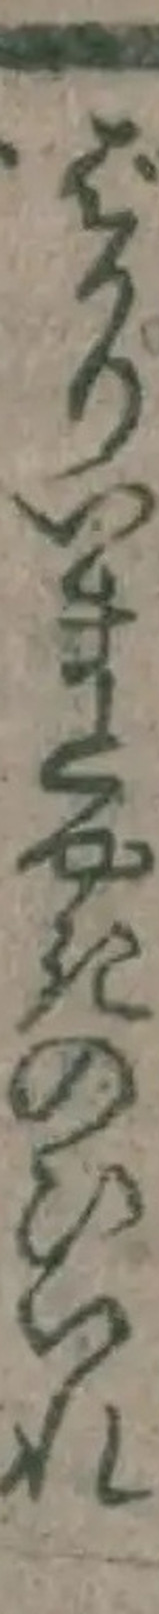ばかりいまとやきのひいれ
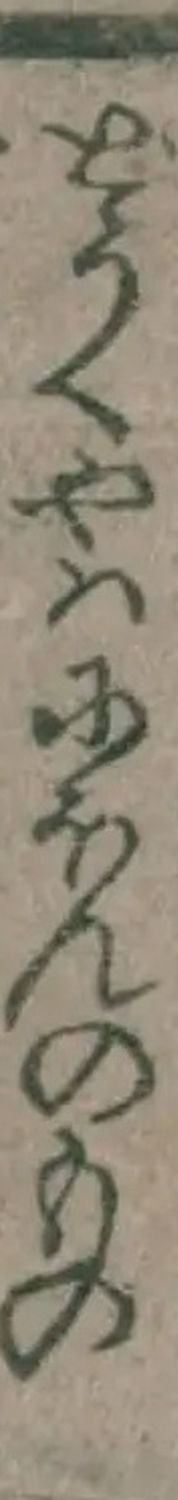どうくやはにほんのもの
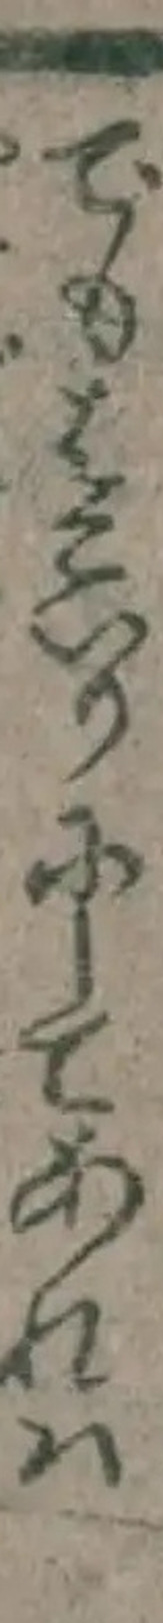でもはこいりにしてあれは
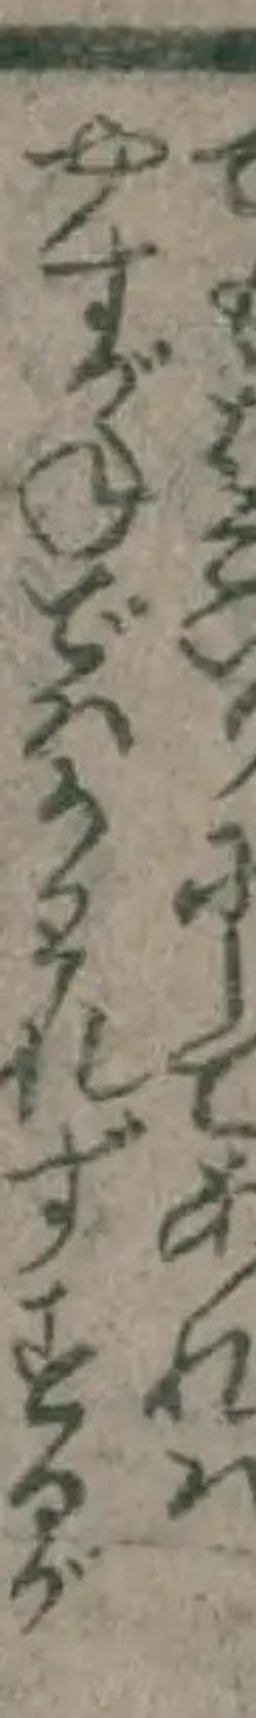やすがねではかわれずするが
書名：縦筒放唐の噺 3巻
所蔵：国立国会図書館 National Diet Library, JAPAN
